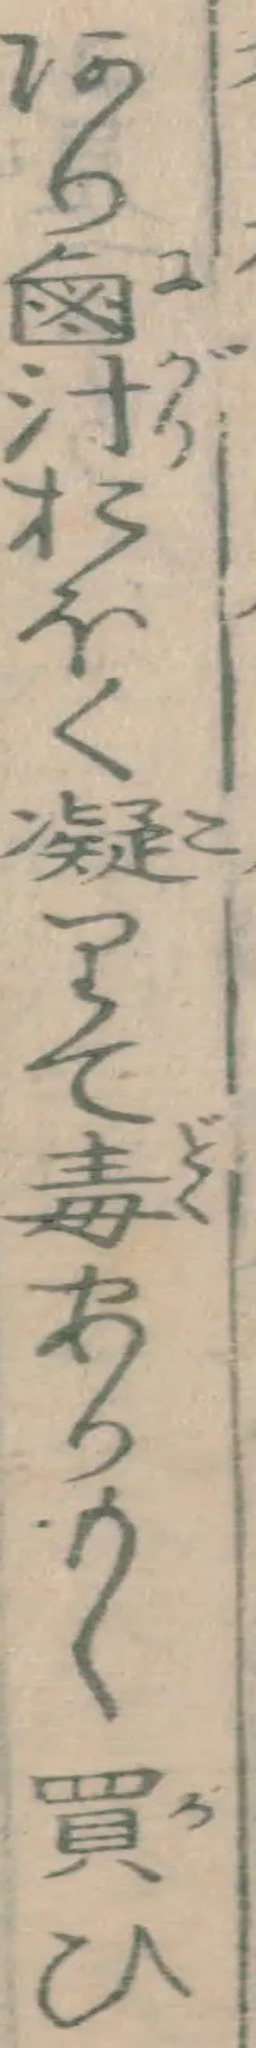あり鹵汁おほく凝りて毒ありもし買ひ
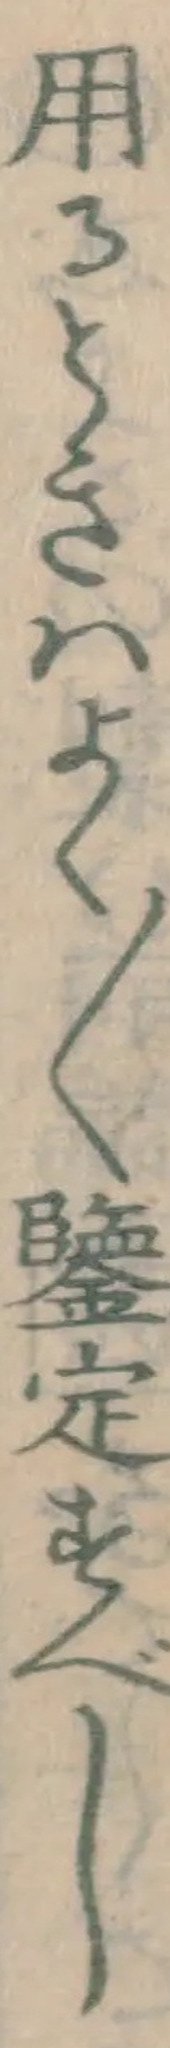用るときはよく〳〵鑑定すべし
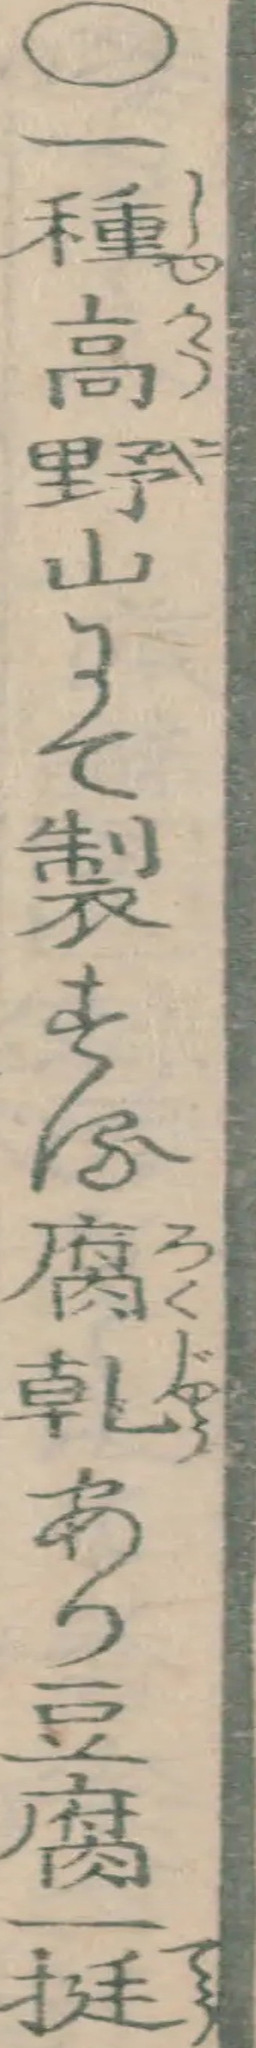○一種高野山にて製する腐乹あり豆腐一挺
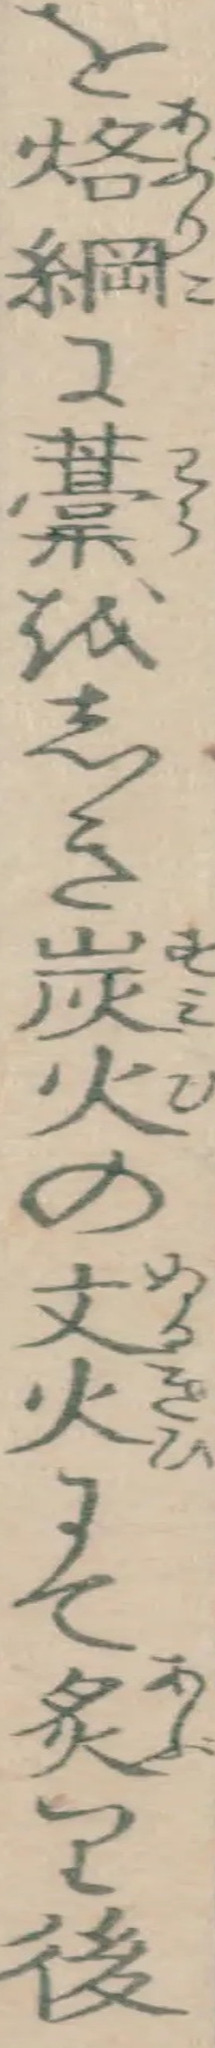を烙綱に藁をしき炭火の文火にて炙り後
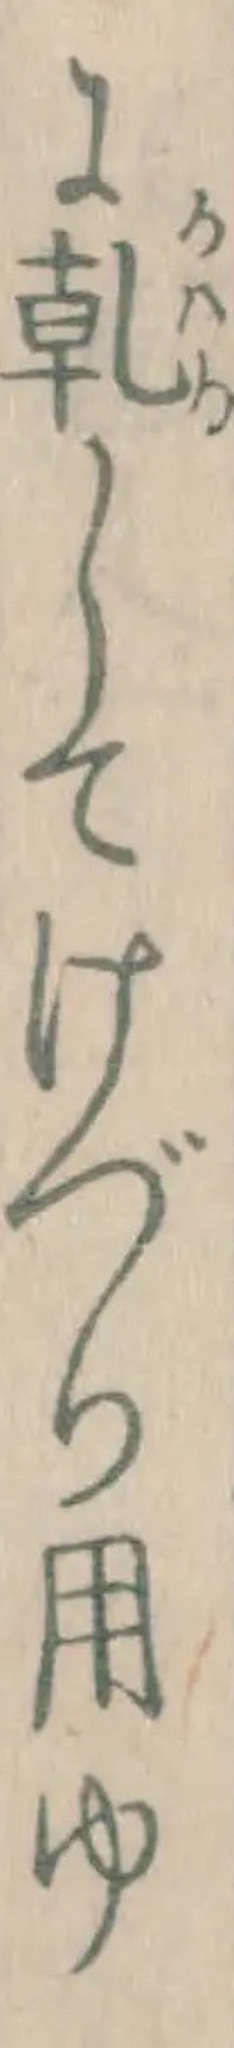に乹してけづり用ゆ
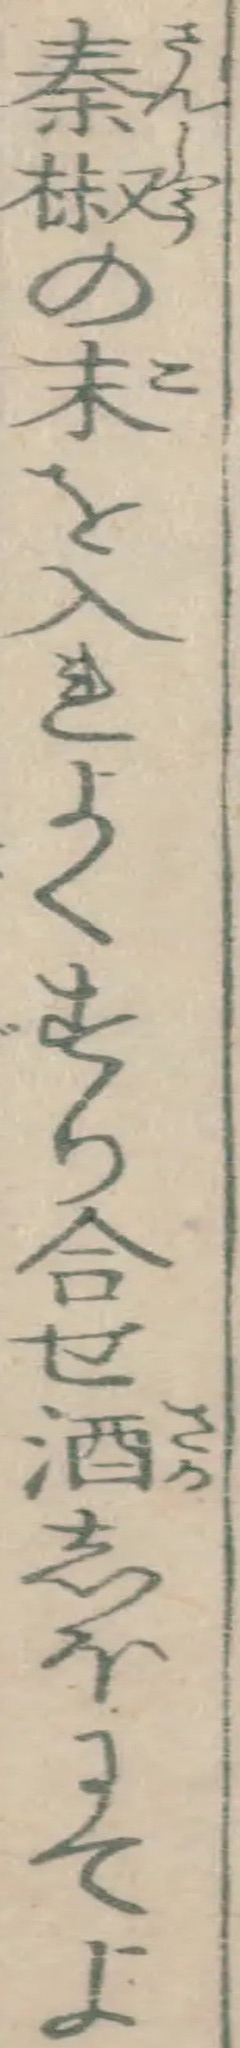秦椒の末を入れよくすり合せ酒しほにてよ
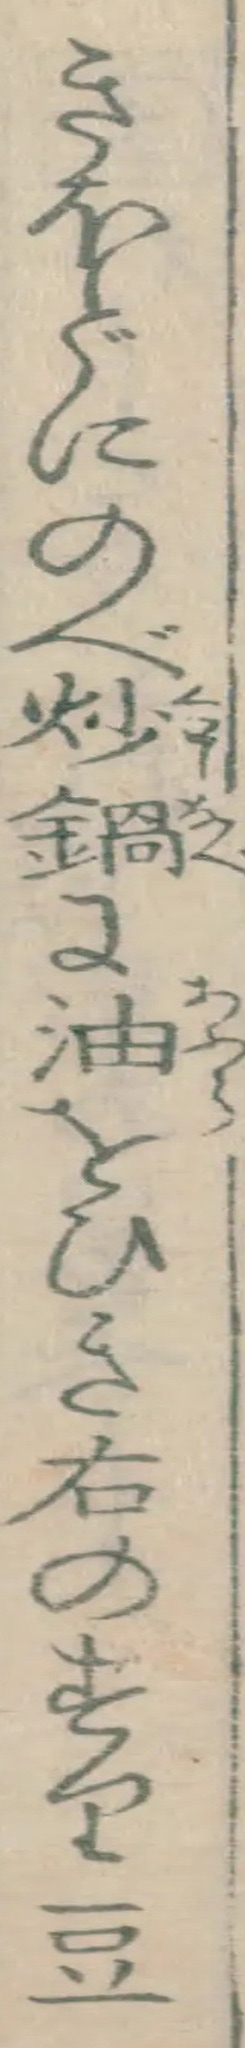きほどにのべ炒鍋に油をひき右のすり豆
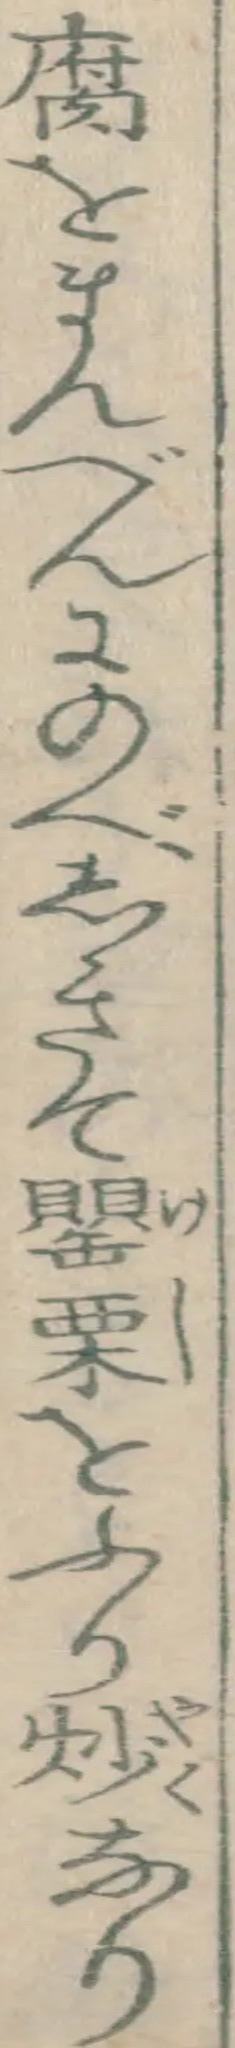腐をまんべんにのべしきて罌粟をふり炒なり
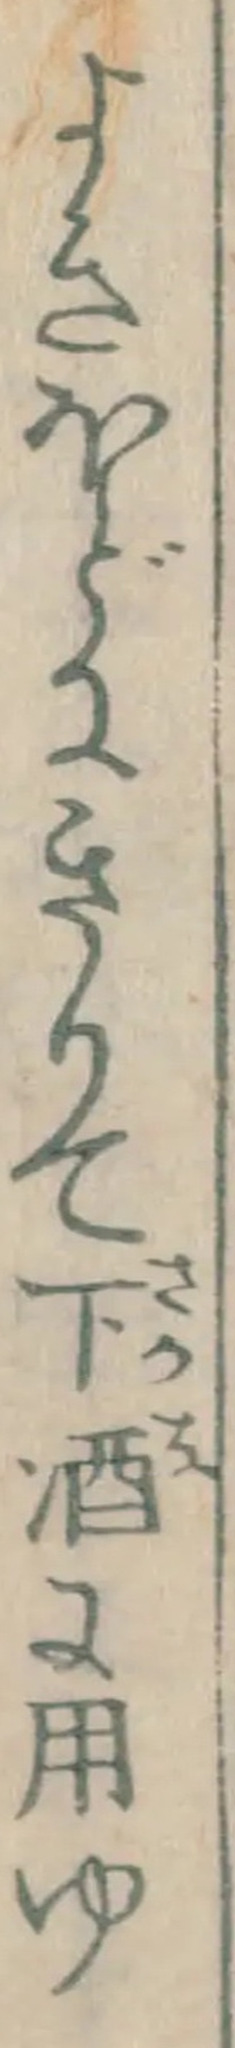よきほどにきりて下酒に用ゆ

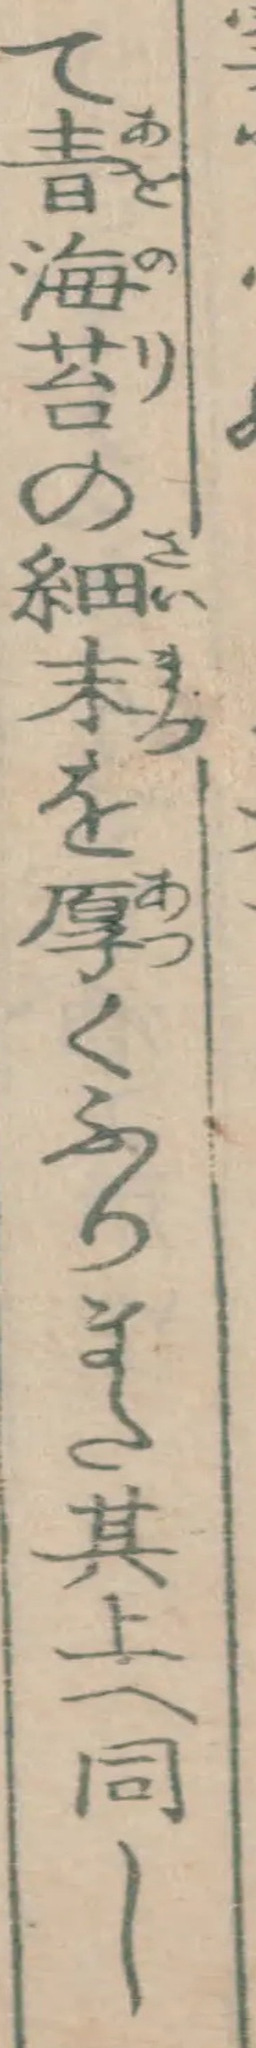て青海苔の細末を厚くふりまき其上へ同し
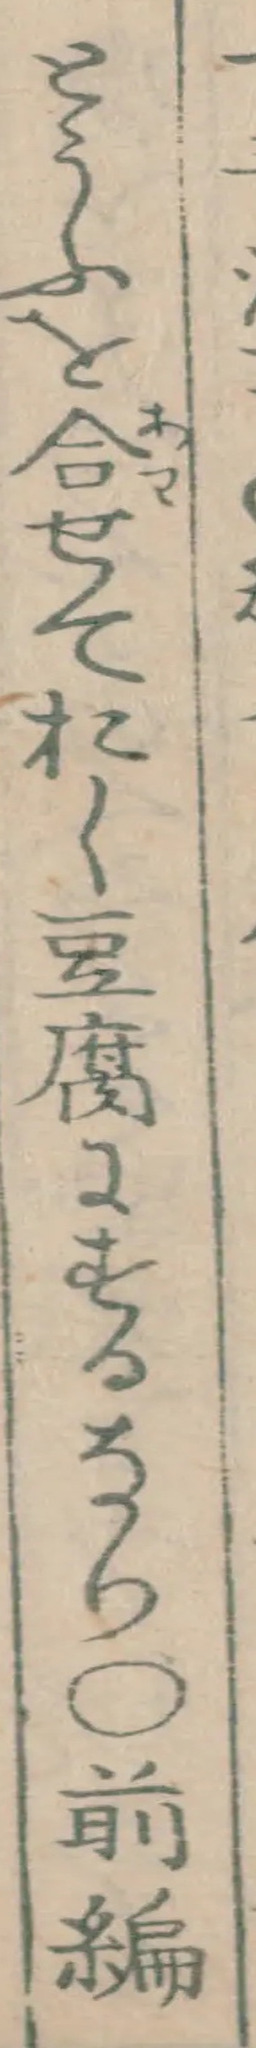とうふを合せておし豆腐にするなり○前編
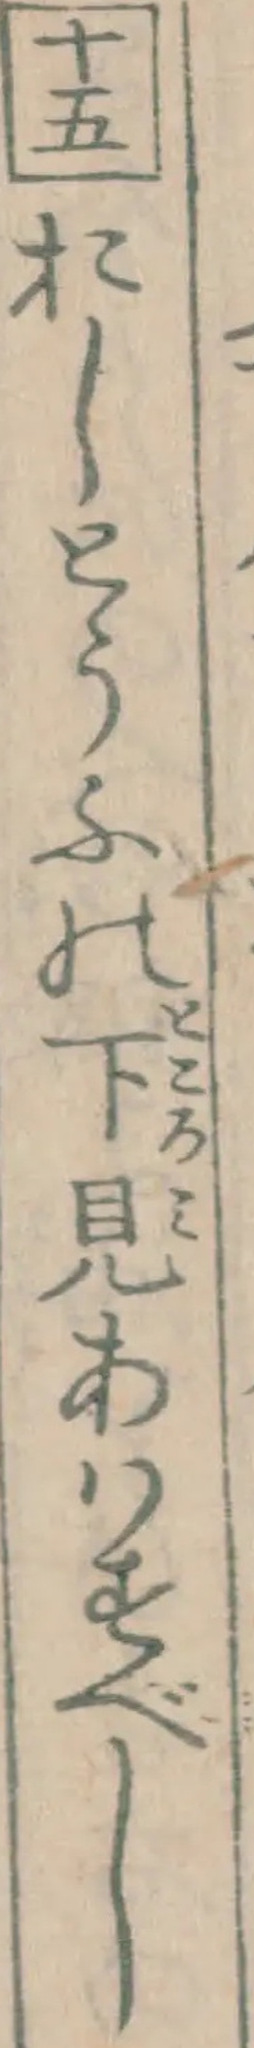十五おしとうふの下見あはすべし
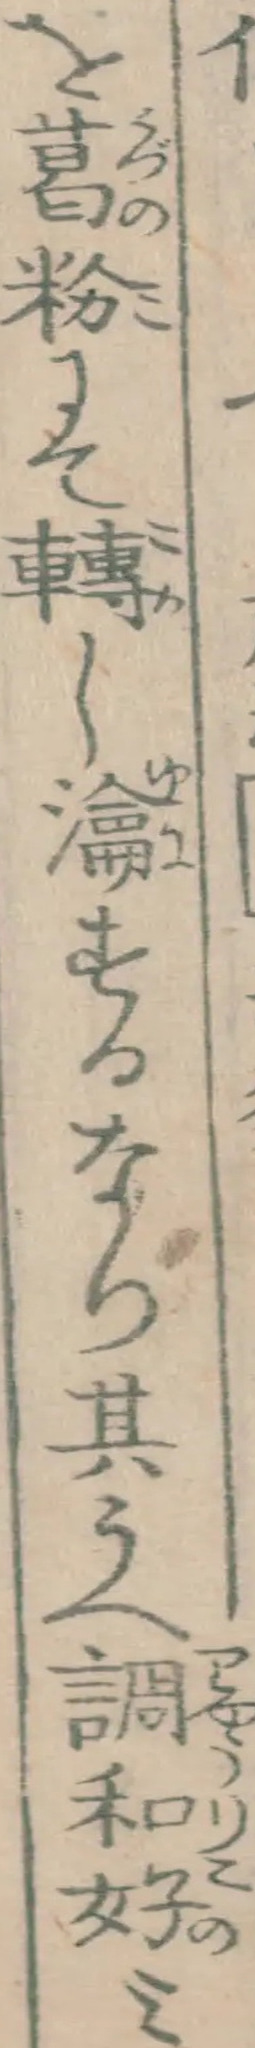を葛粉にて転し瀹するなり其うへ調和好み
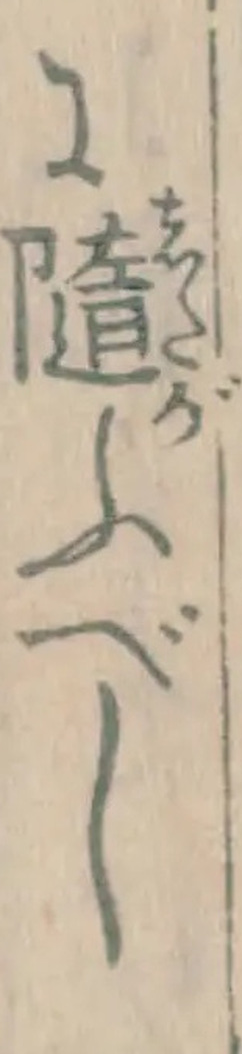に随ふべし
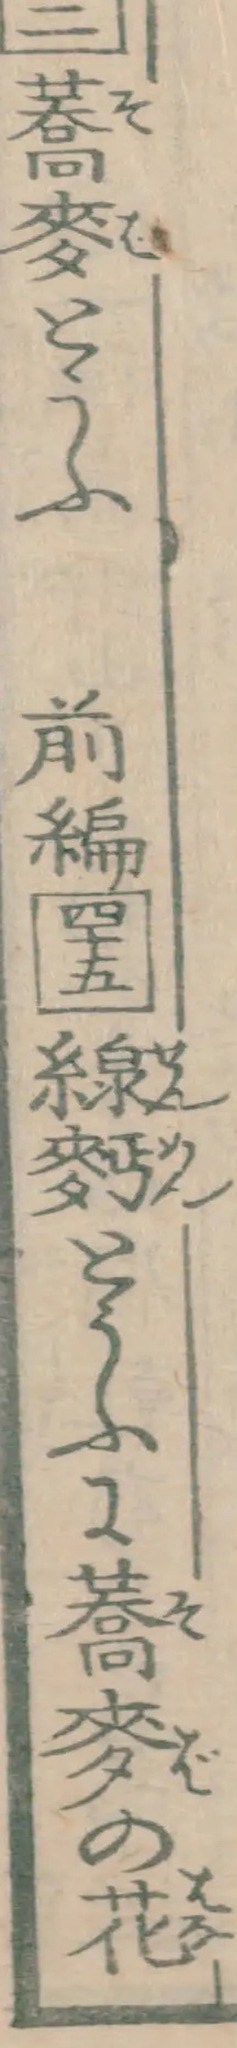卅二蕎麦とうふ前編四十五線麺とうふに蕎麦の花
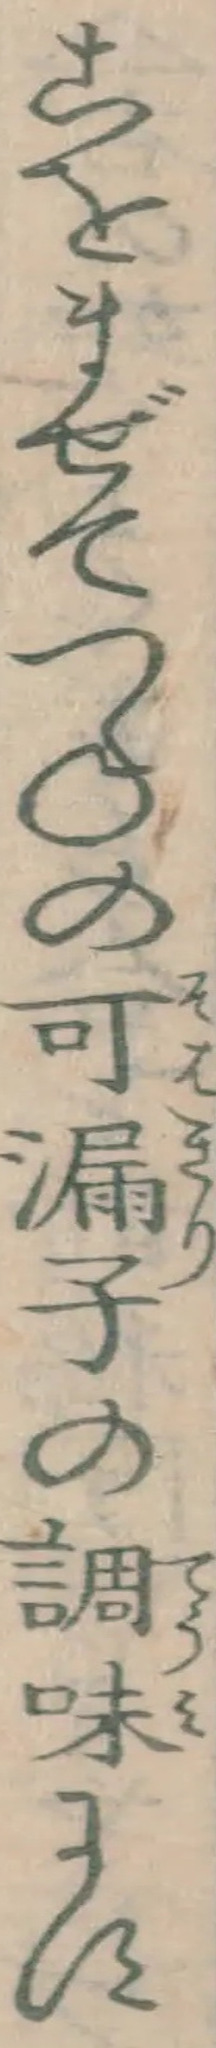こをまぜてつねの可漏子の調味にす
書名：豆腐百珍. 続編
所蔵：国立国会図書館 National Diet Library, JAPAN
